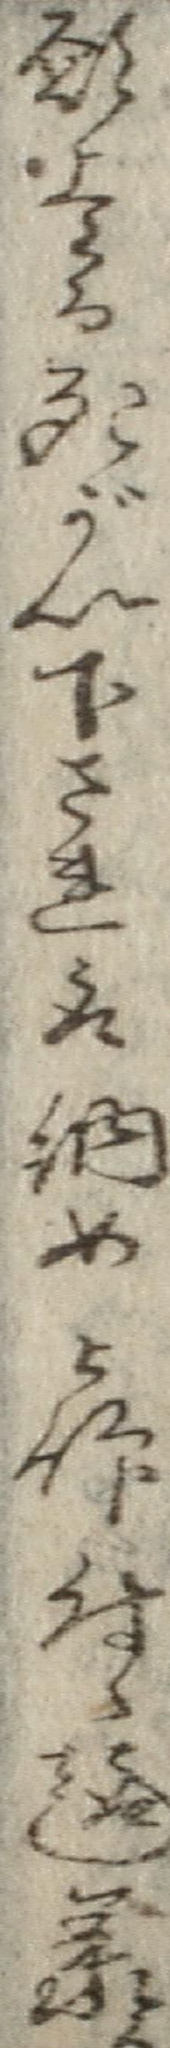願上候而死がい下され取納め被仰付候趣承り
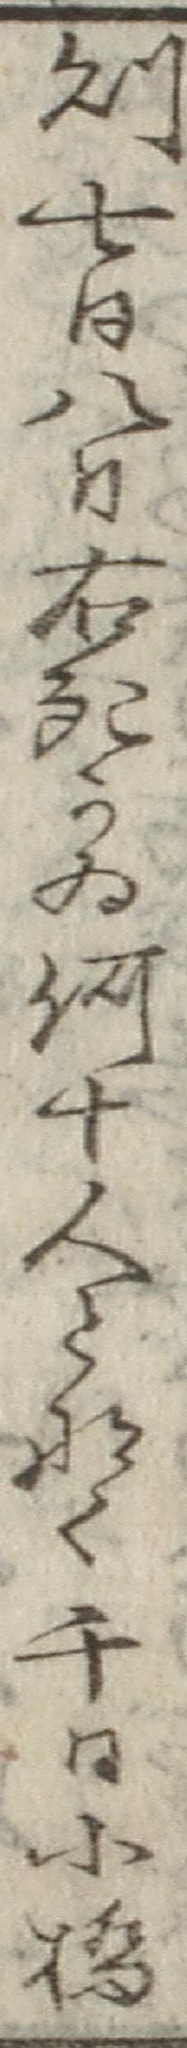則七日八日右死かゐ何十人となく千日小橋
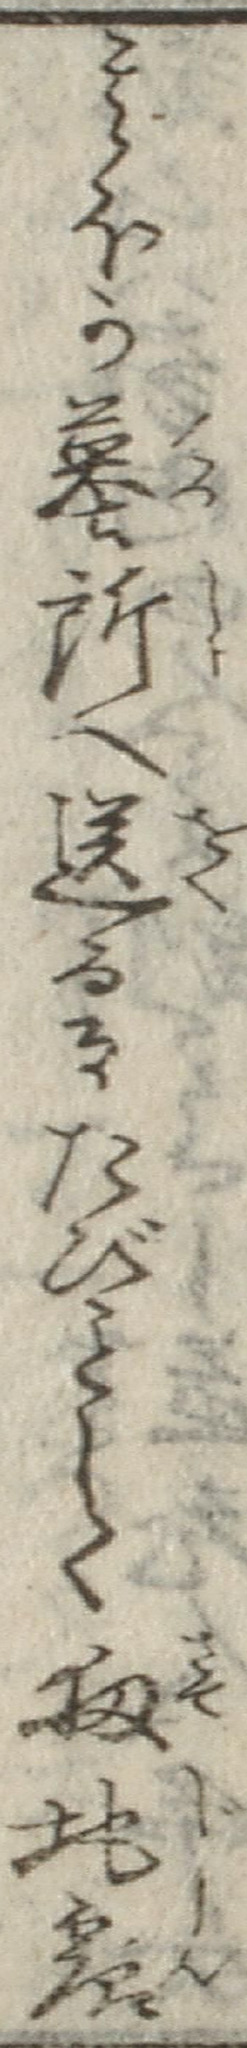其ほか墓所へ送る事たびことしく扨地震
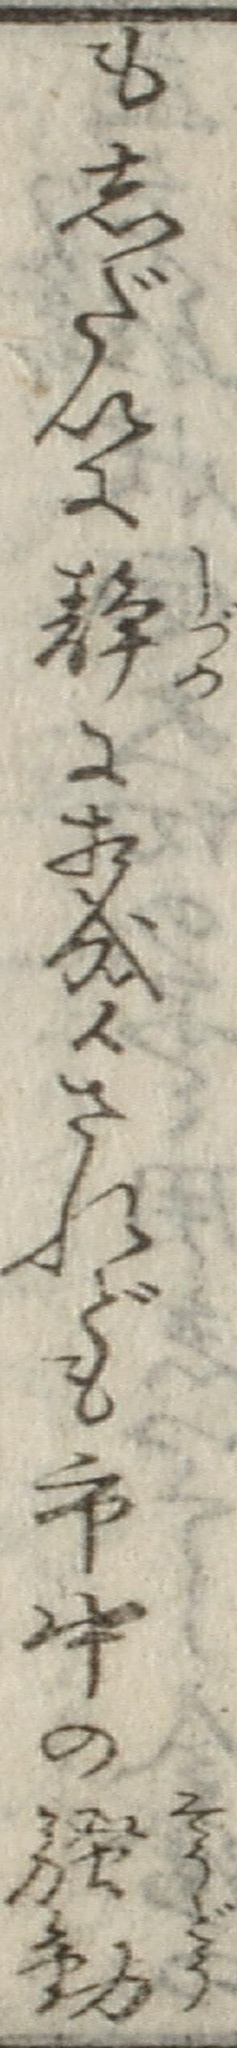もしだいに静に相成候されども市中の騒動
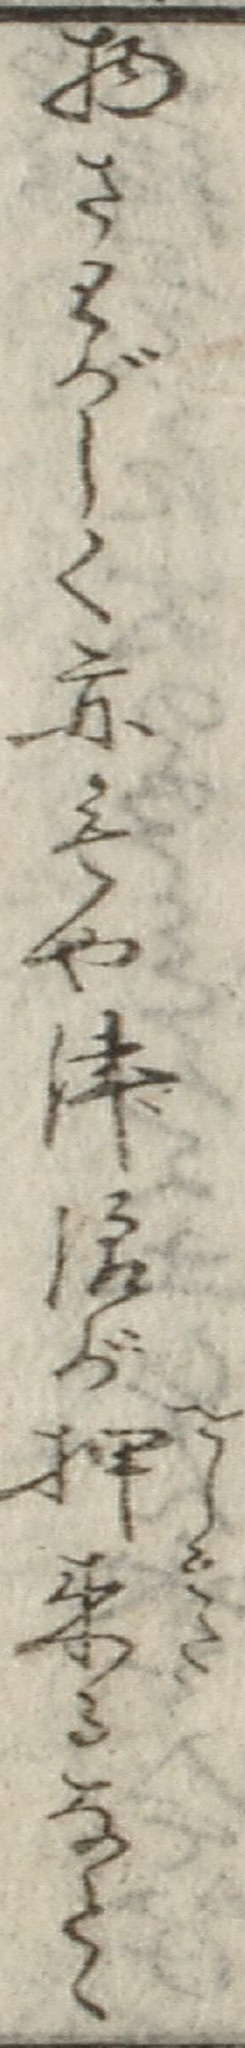物さわがしく亦もや津浪が押来るなとゝ
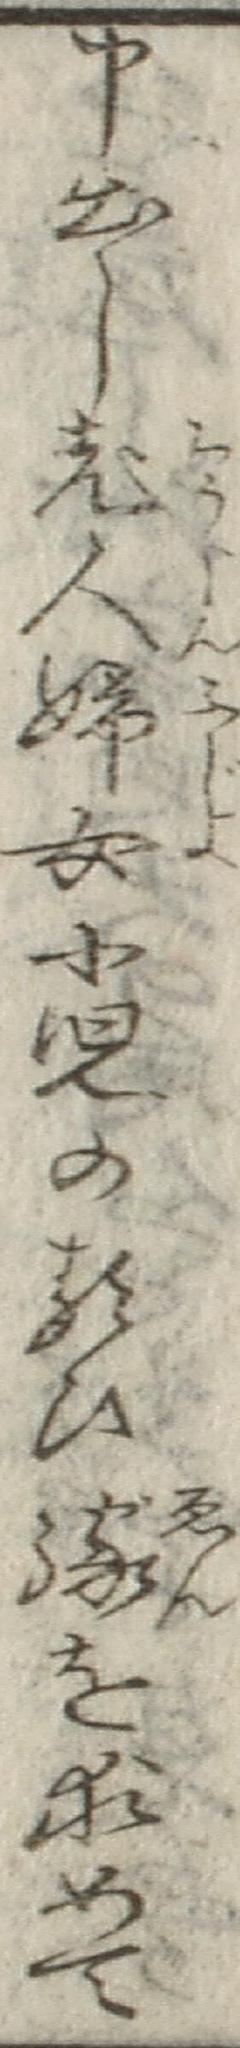申出し老人婦女小児の類ひ縁を求めて
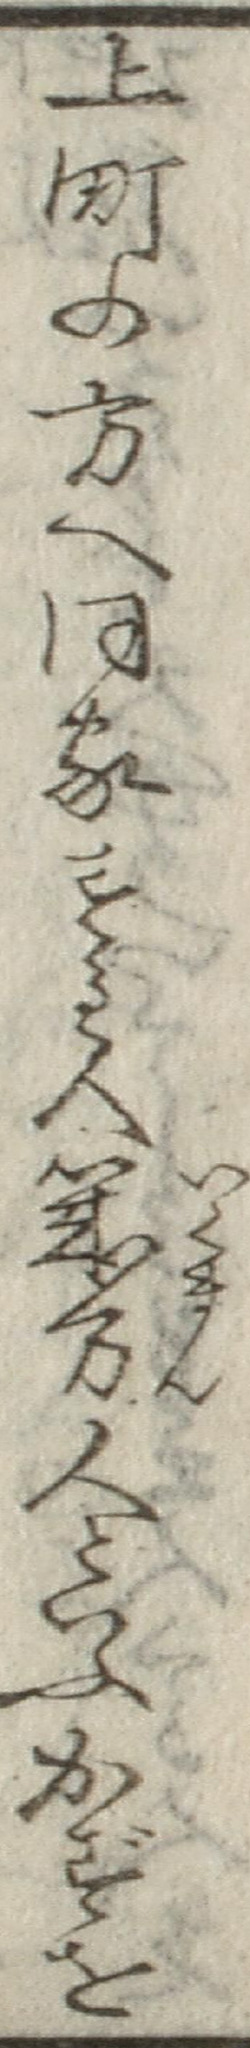上町の方へ同家する人幾万人といふかずを
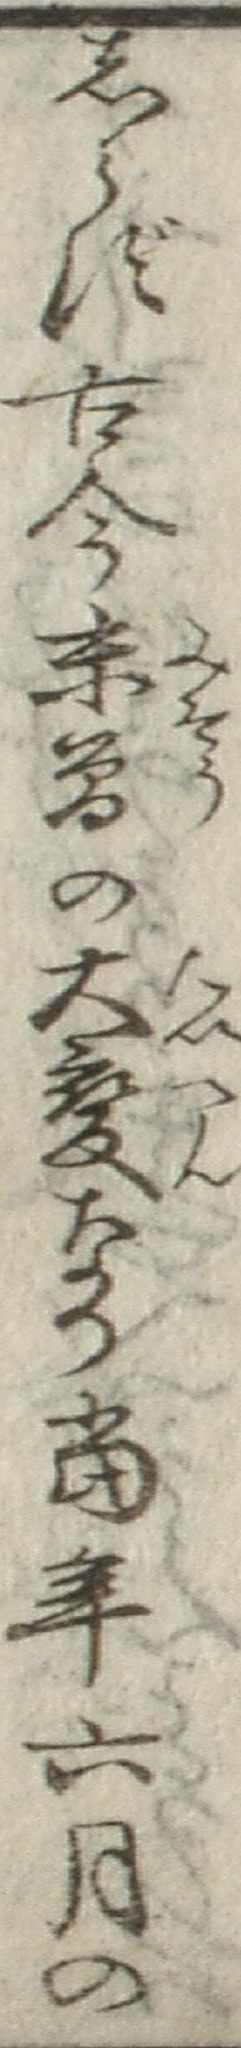しらず古今未曽の大変なり当年六月の
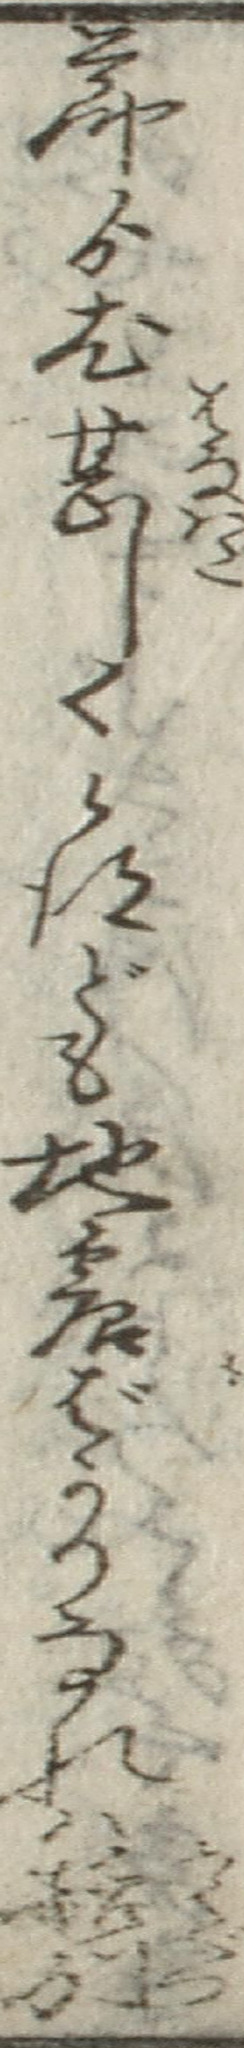節ゟ尤甚しく候得ども地震ばかりなれハ格別

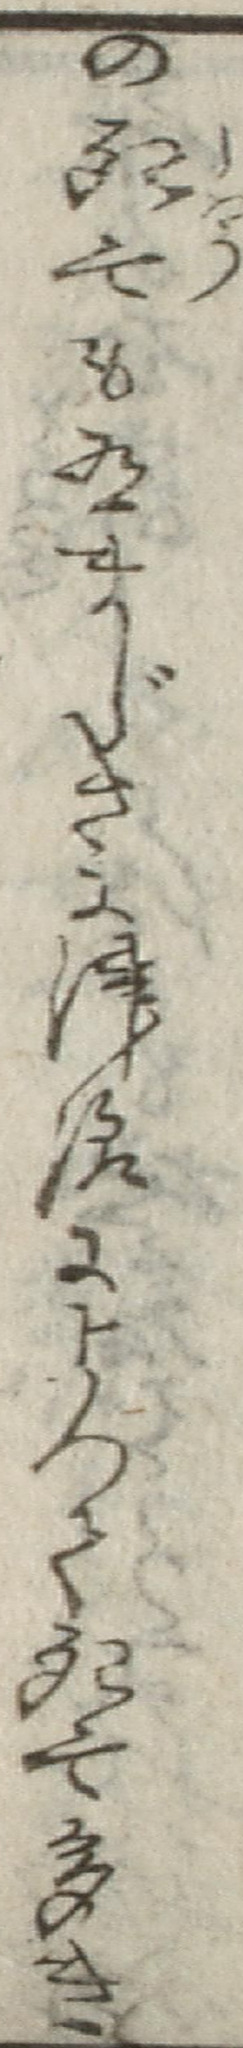の死亡も有まじきに津浪によつて死亡多き
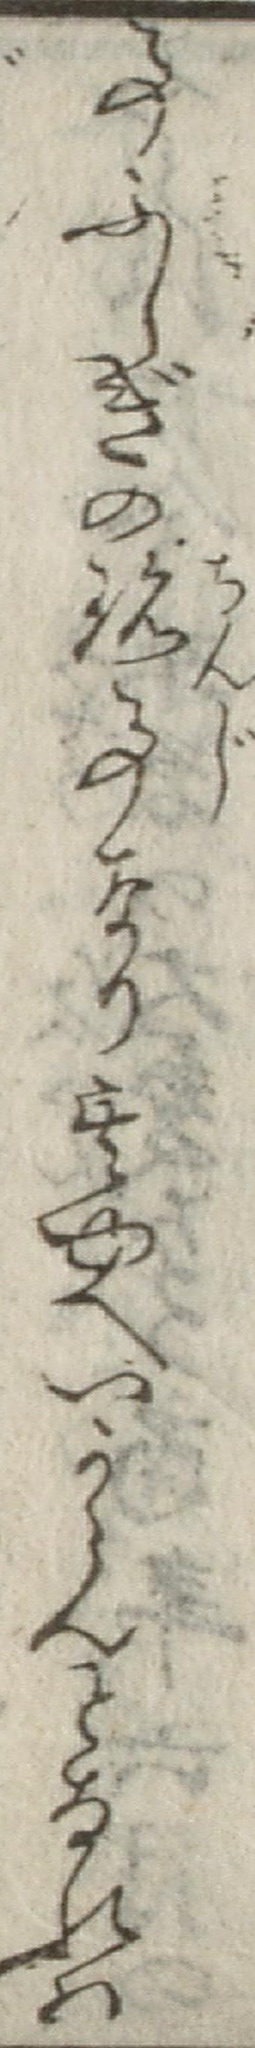事ふしぎの珍事なり其ゆへいかゝんことなれハ
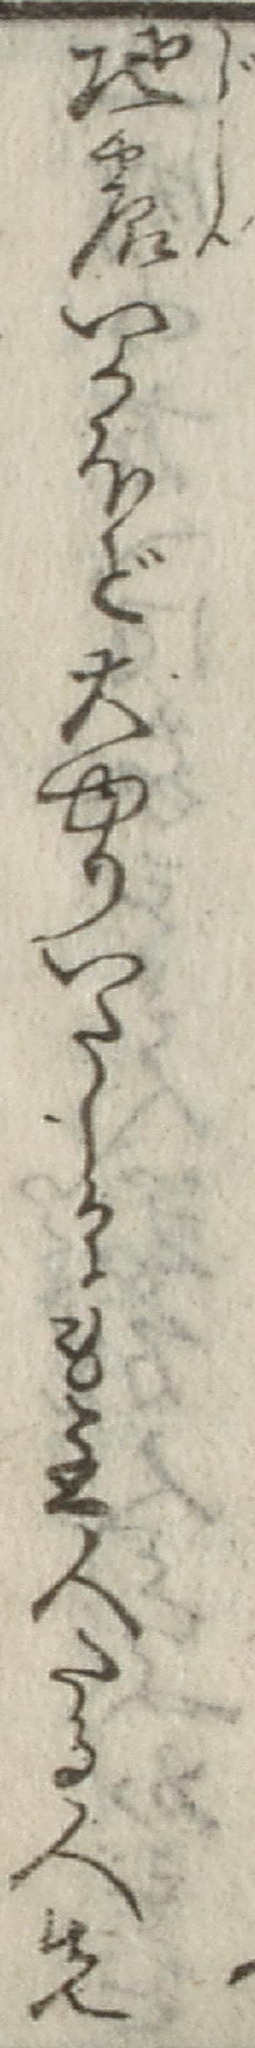地震いかほど大ゆりいたし候にも主人たる人先
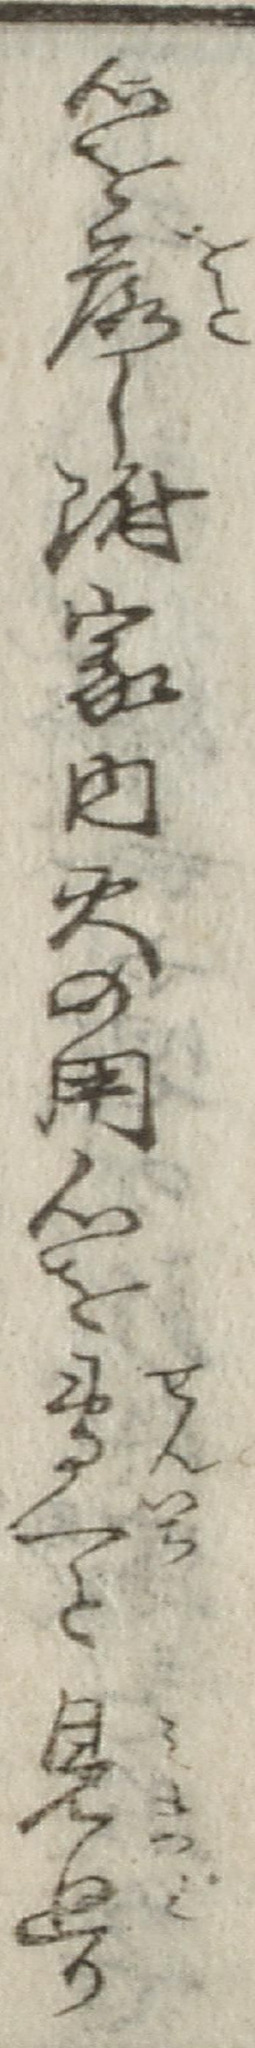心を落し附家内火の用心を専一と見廻り
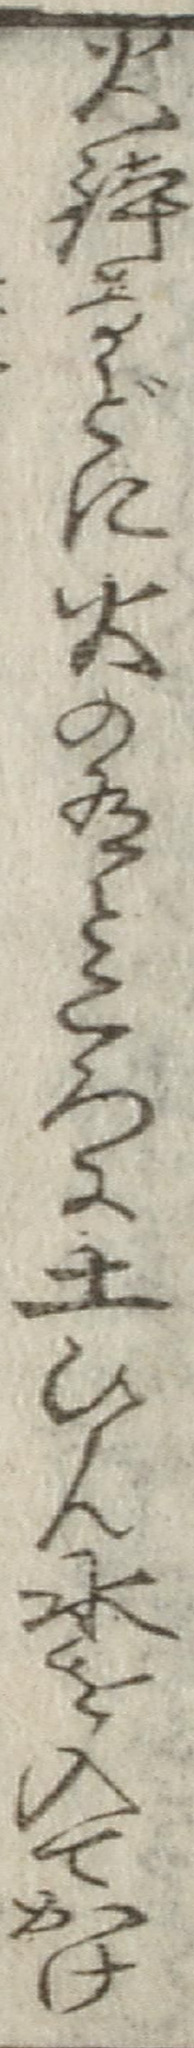火鉢などに火の有ところに土ひん水を入てかけ
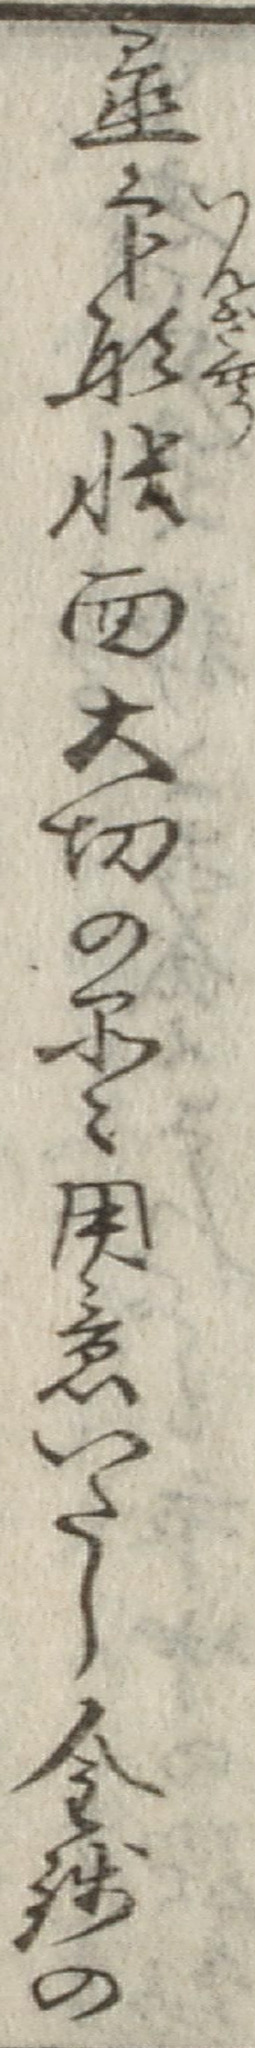置印形帳面大切の品〻用意いたし金銭の
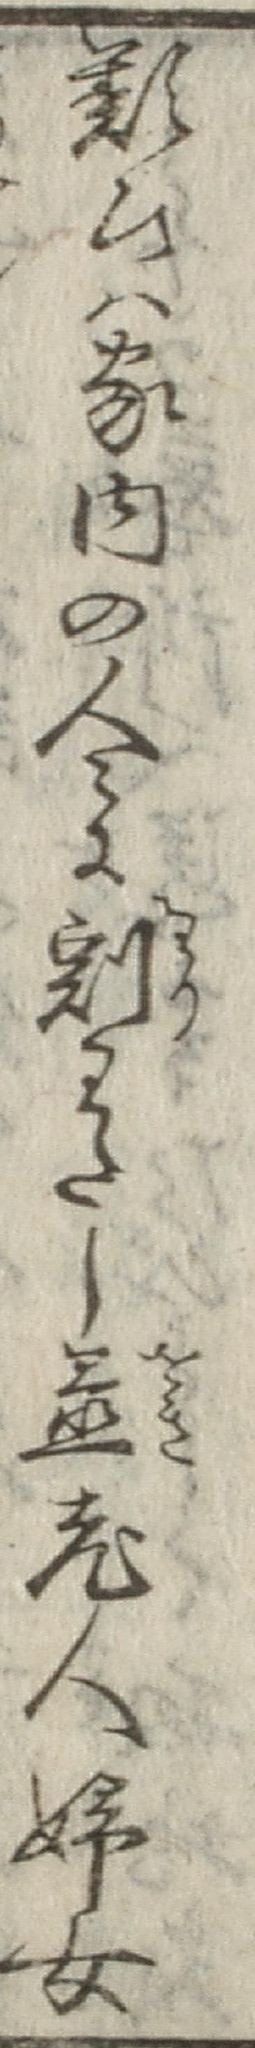類ひハ家内の人〻に割わたし置老人婦女
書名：世直り艸紙
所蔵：東京大学地震研究所図書室 Earthquake Research Institute Library, The University of Tokyo, JAPAN
